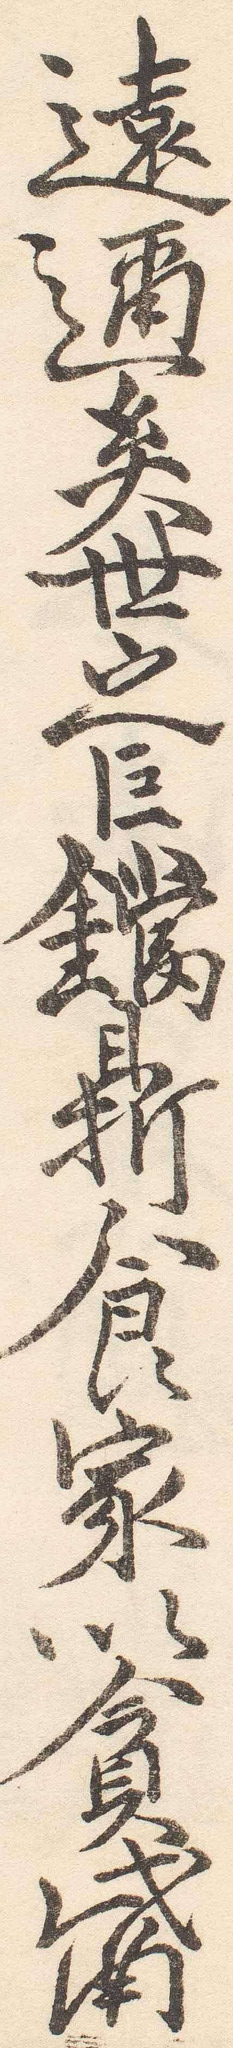遠邇矣世之巨鐺鼎食家以貪觜
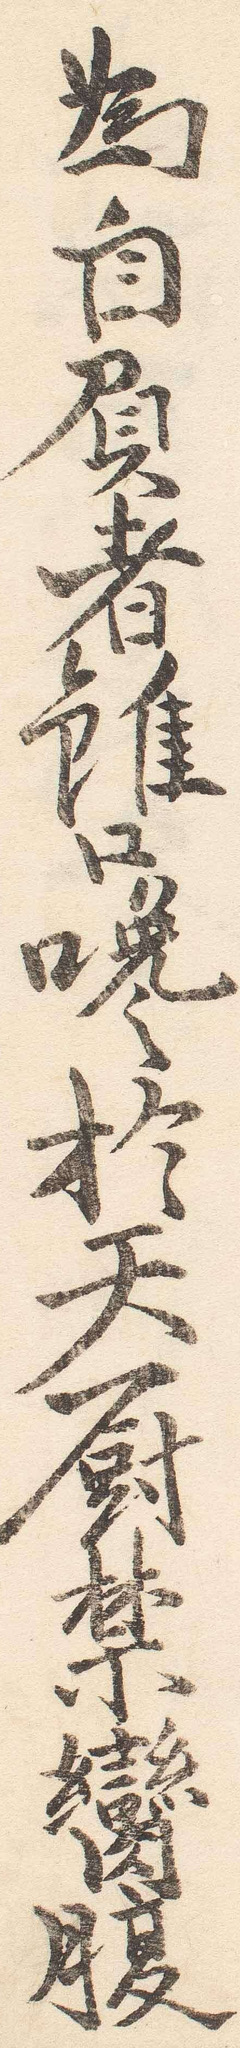為自負者雖口嚵於天厨禁臠腹
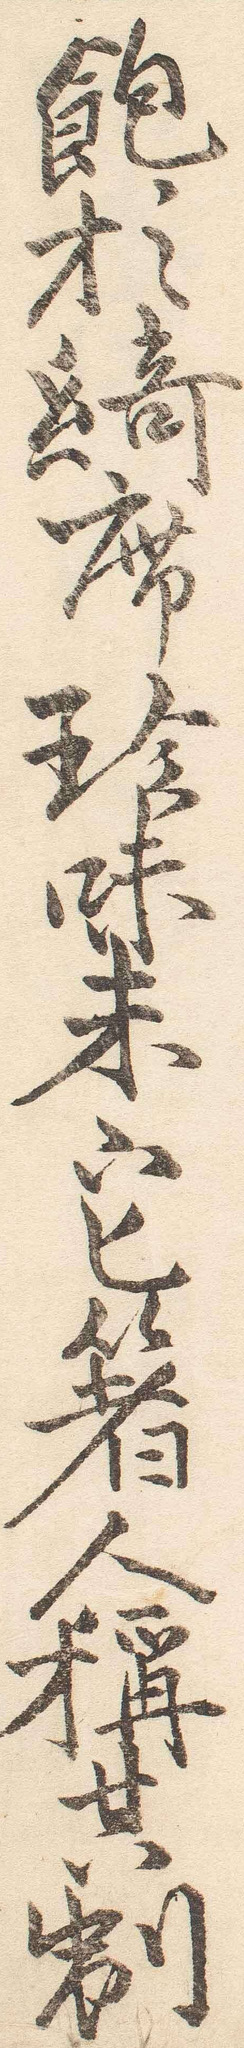飽於綺席珍味未下匕箸人稱其制
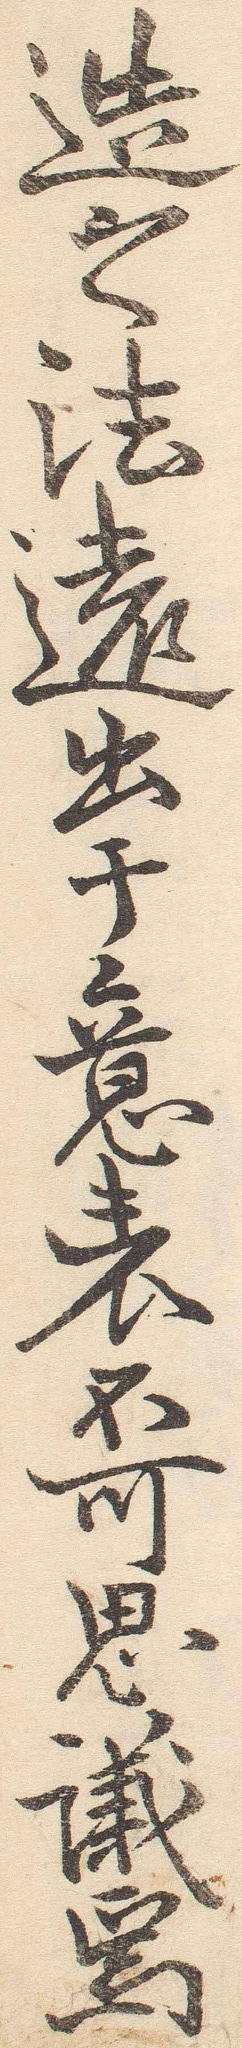造之法遠出于意表不可思議焉

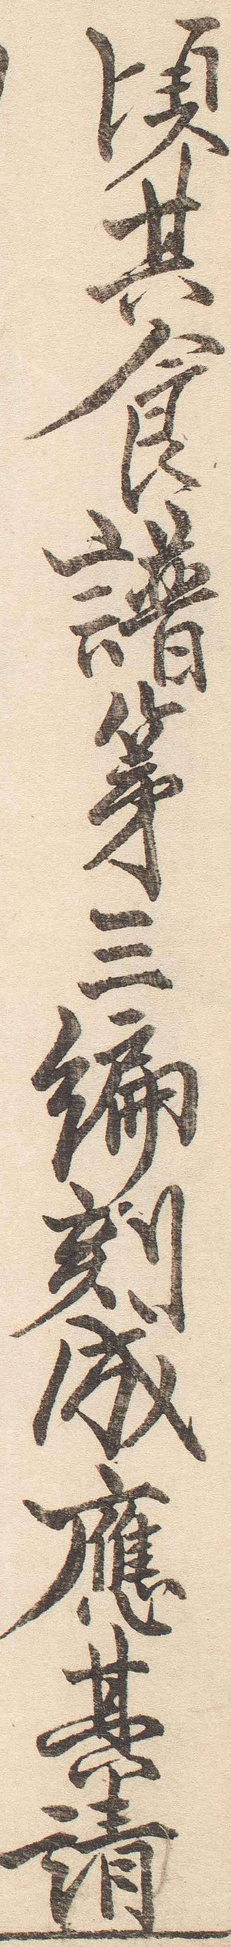頃其食譜第三編刻成應其請
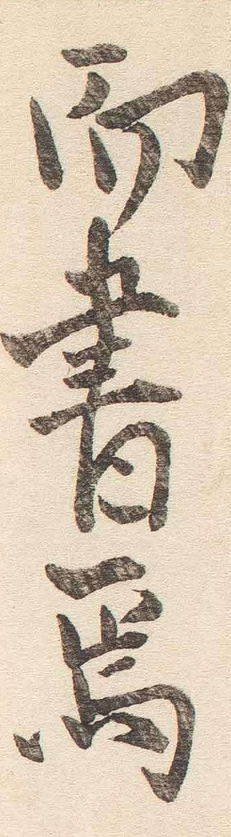而書焉
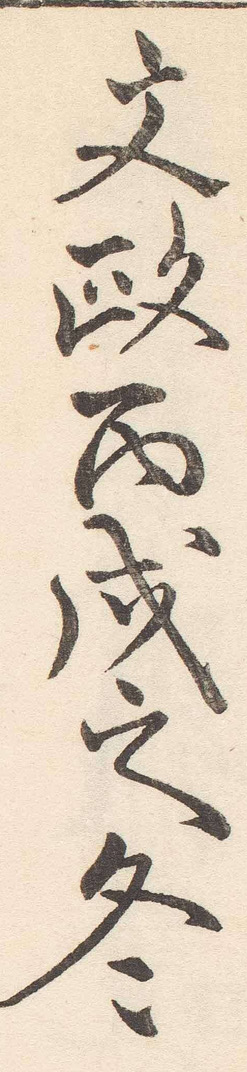文政丙戌之冬
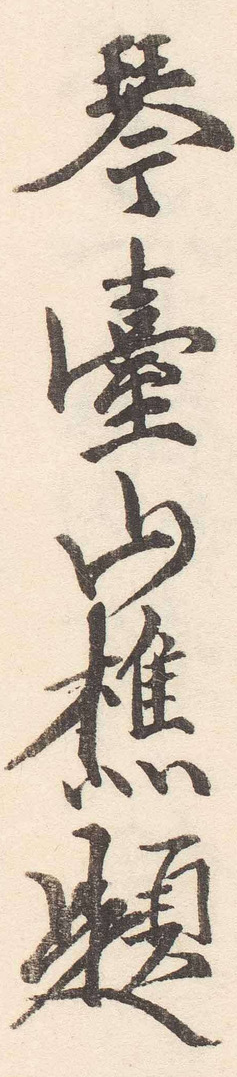琴臺山樵題
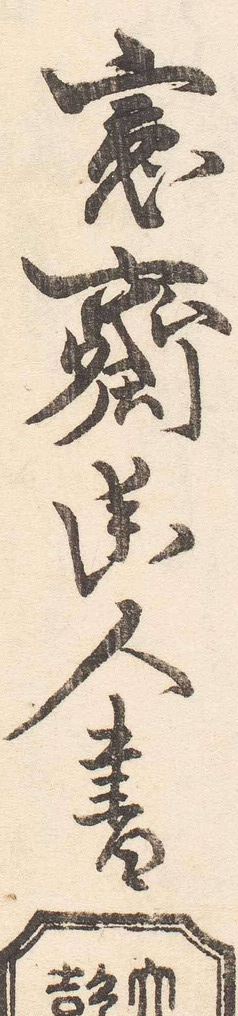憲齋幽人書
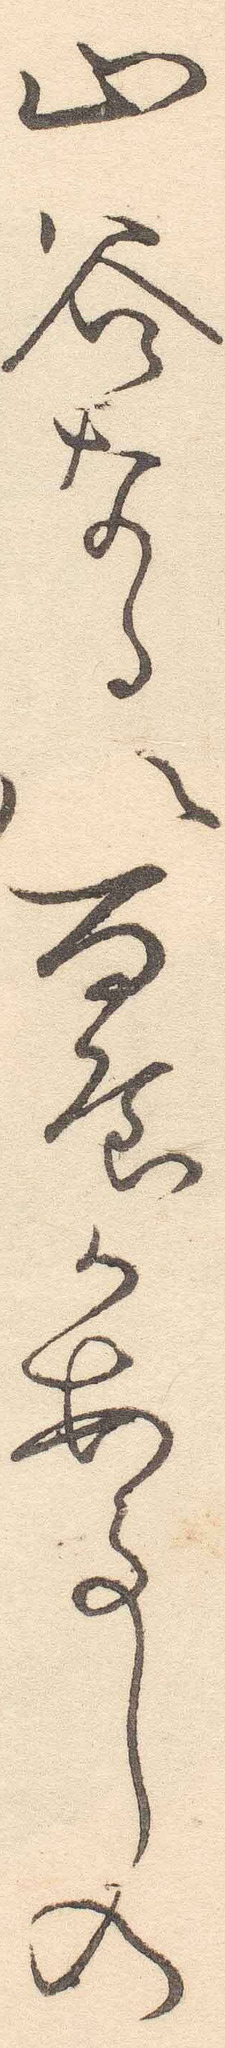山谷なる八百善かあるしの
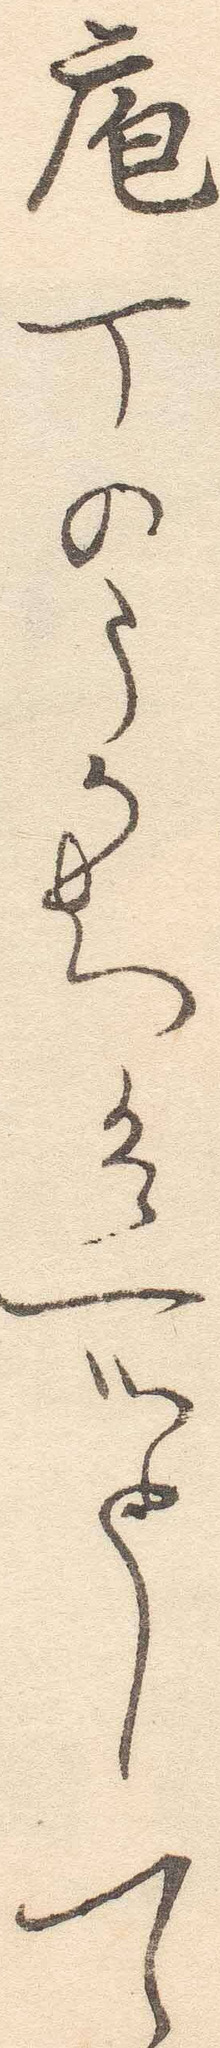庖丁のうかちは一つとして
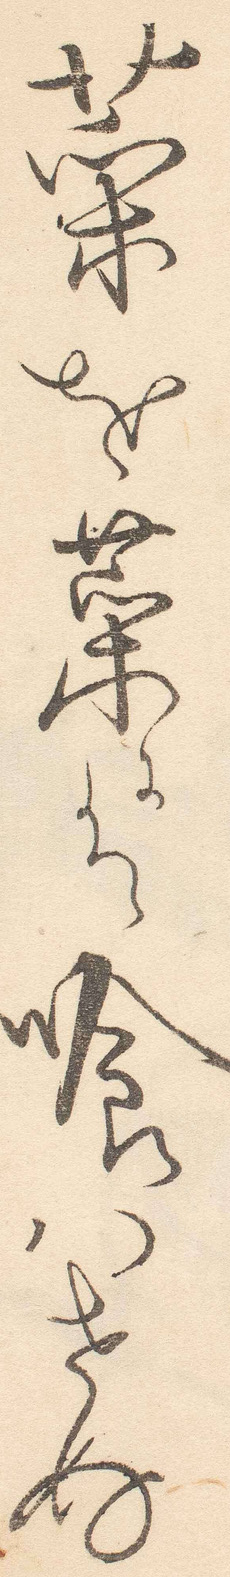菜を菜には喰はさぬ
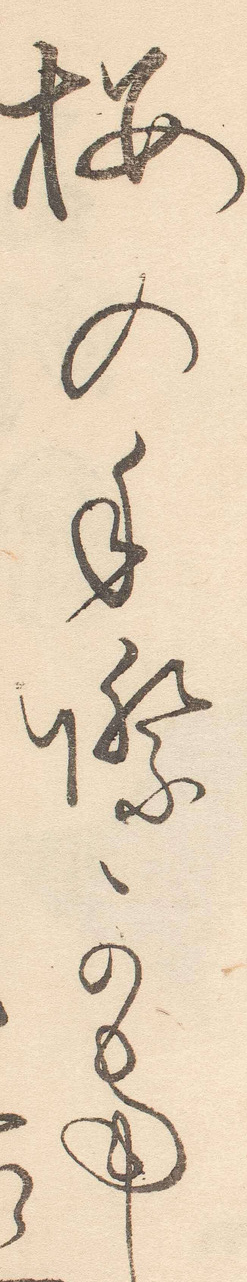梅の手際かな

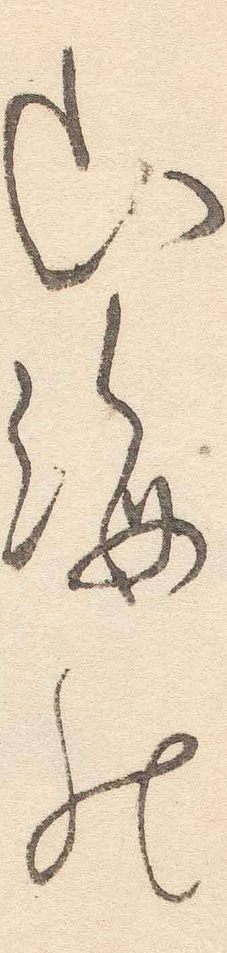山海の
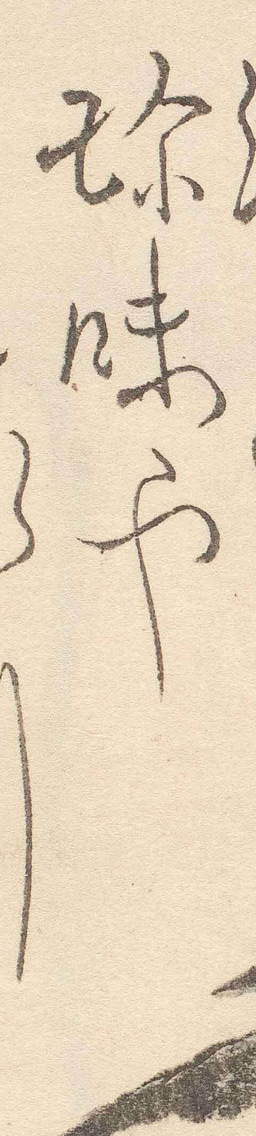珍味や
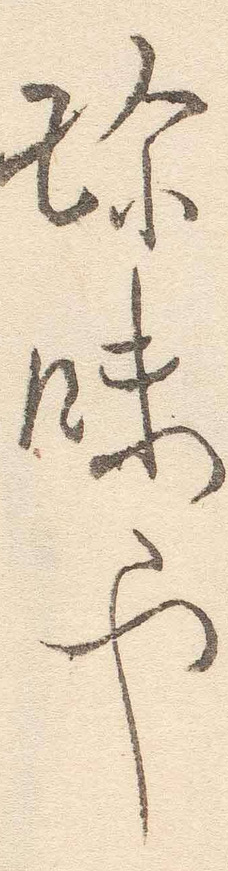珍味や
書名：料理通
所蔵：東京学芸大学附属図書館 国文学研究資料館
